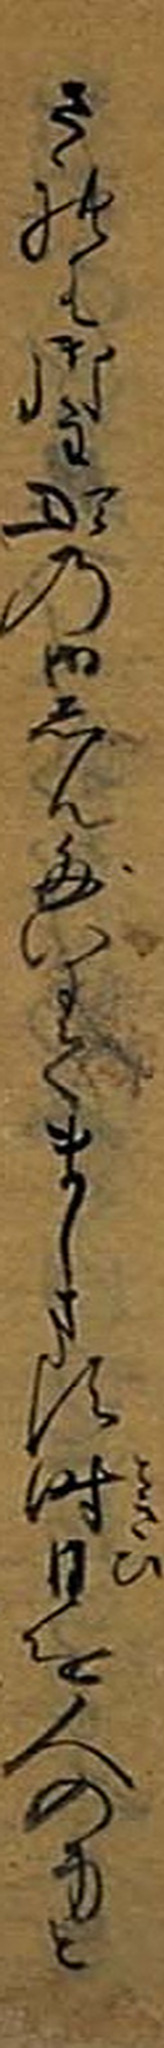されば御主Ⅾの御しんたいにてまします時日を人の身と
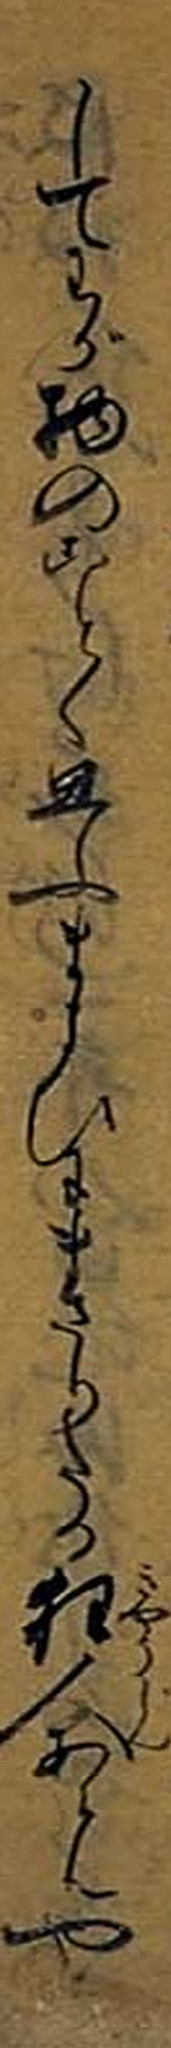してわが物のことく思ふまよひにまさりたる狂人あらんや
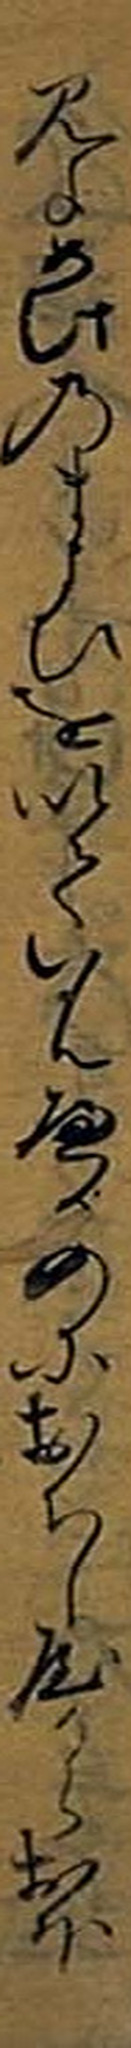見よ如此のまよひを以ていんへるのにおちしやからおほ
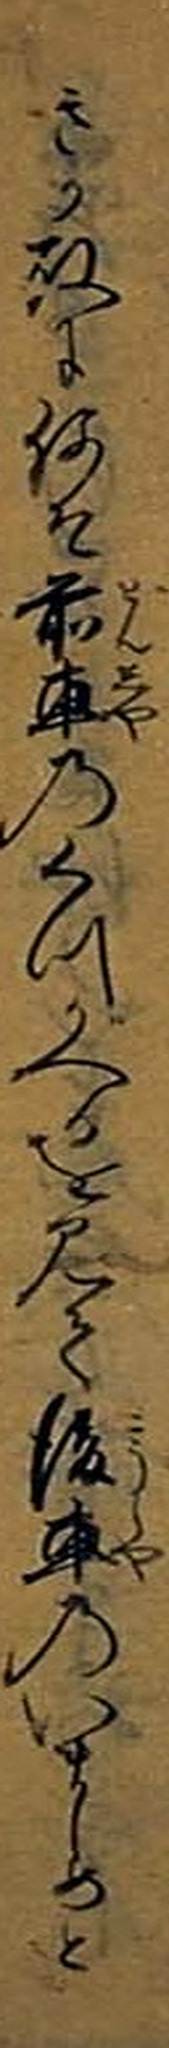きが故に何そ前車のくつがへるを見て後車のいましめと
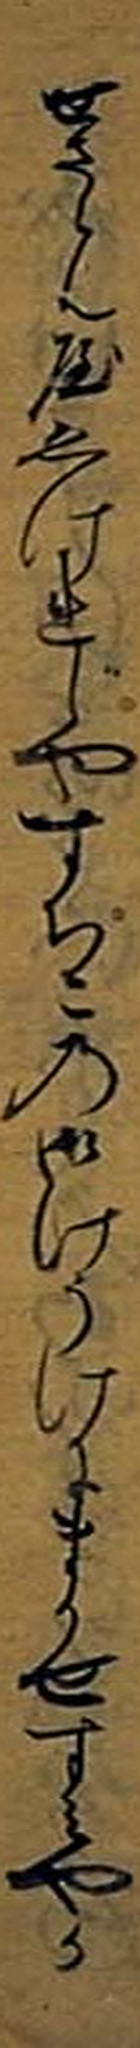せさらんやゑけれじやすちこの御けうけにまかせすみやか
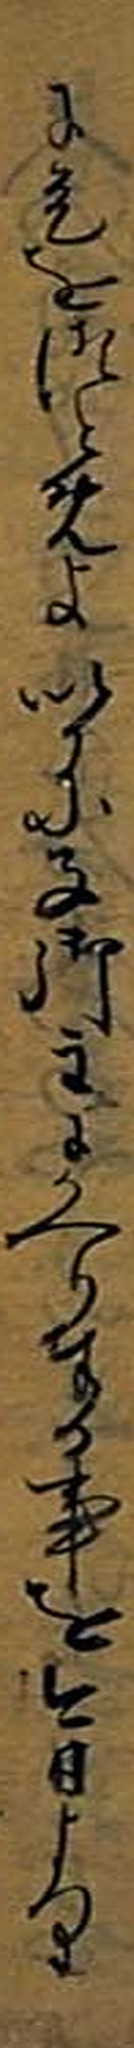に是をつとめよいかに子御主にかへり奉る事を今日より
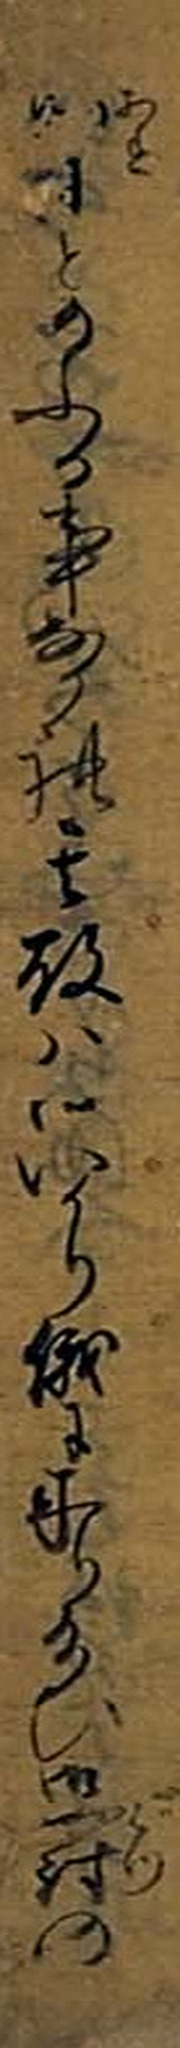明日とのふる事なかれ其故は御いかり俄に来り給ひ御罸の
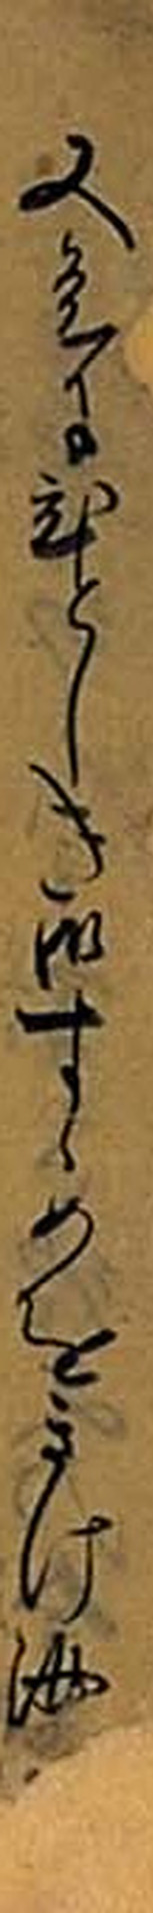又是にひとしき御すゝめをきけ汝
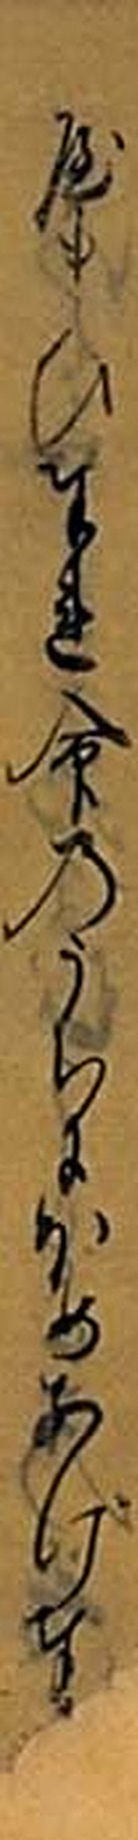やまひ奉れ命のうちにほめあげ奉
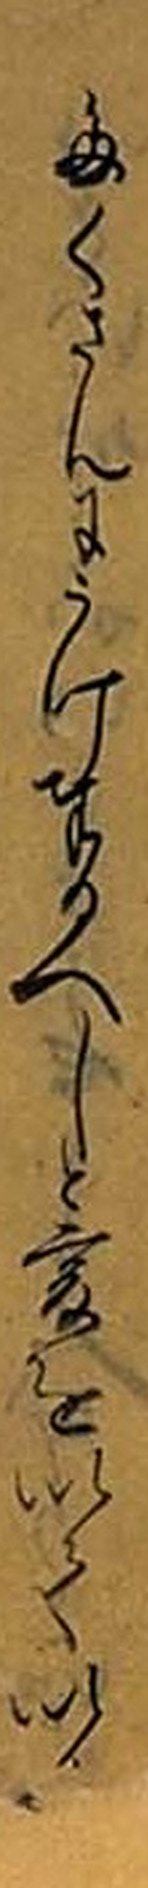たくさんにうけ奉るへしと爰を以てい
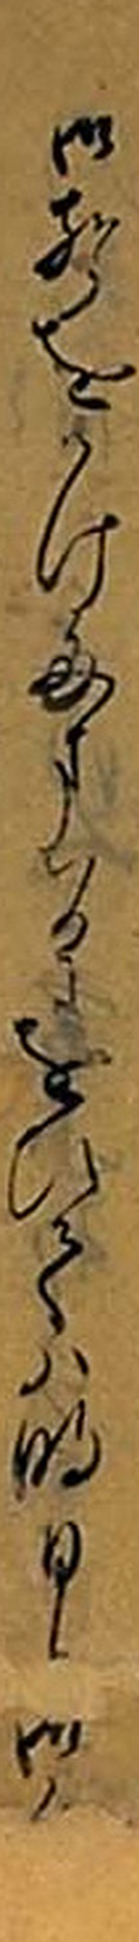御声をかけたまはるにをひては明日と御
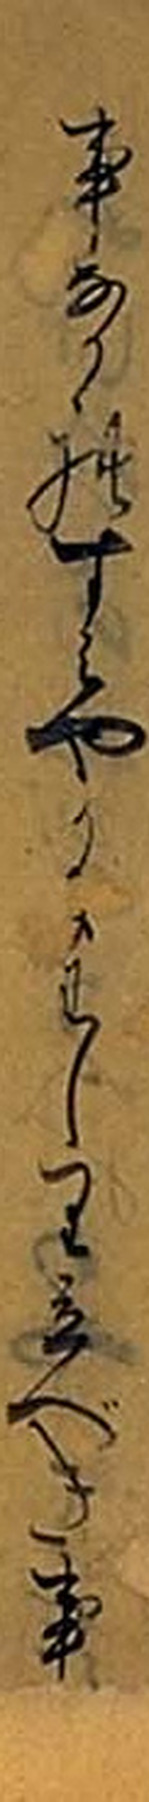事なかれすみやかわしり立べき事
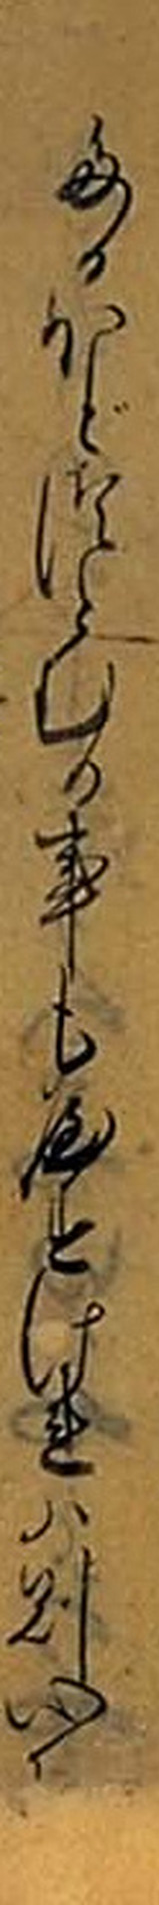たるほどつとむる事もやすければ則心
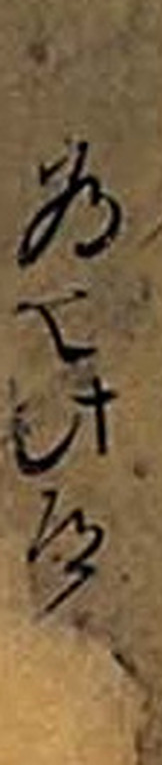為也此道

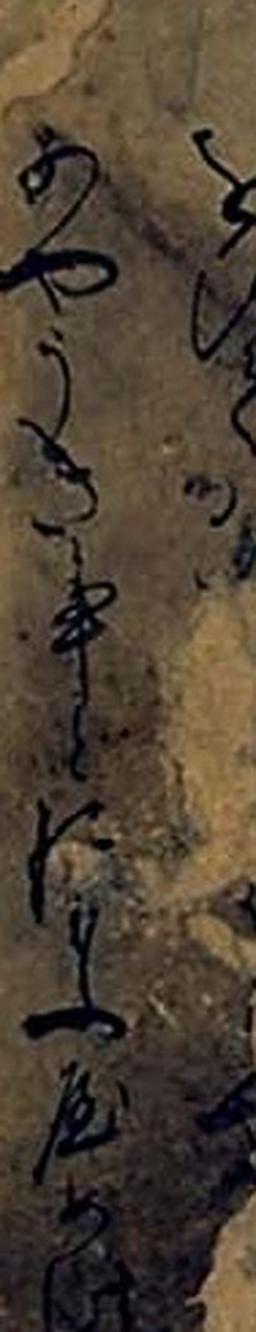あやうき事とおもふや如此
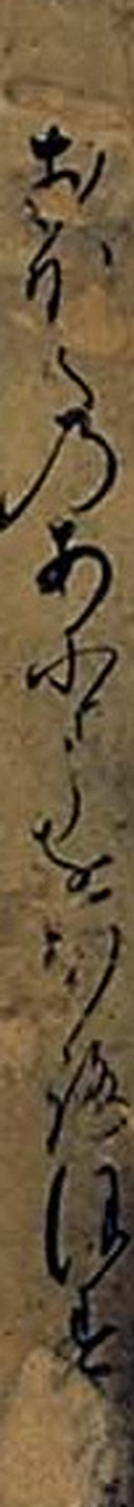おほくのあにまをほろほすに
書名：ぎやどぺかどる
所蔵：東京大学総合図書館 / General Library in the University of Tokyo
